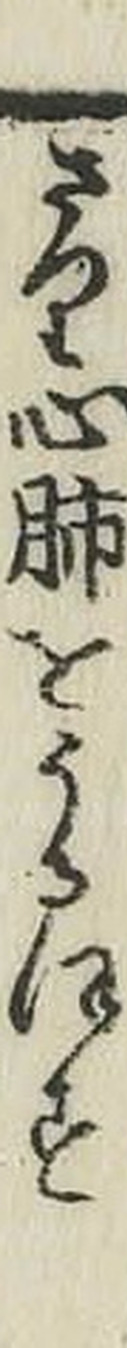さり心肺をうるほす
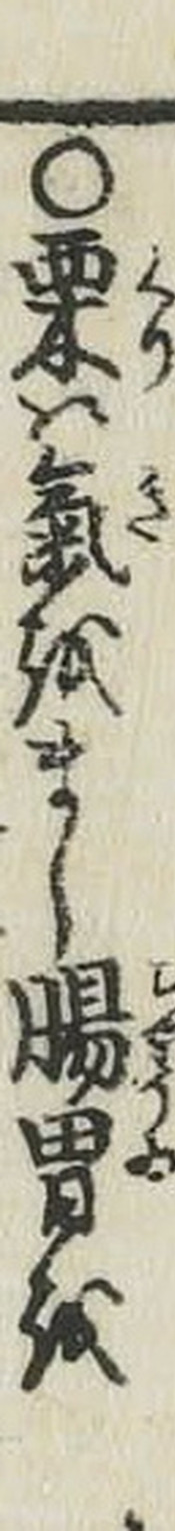○栗は気をまし腸胃を
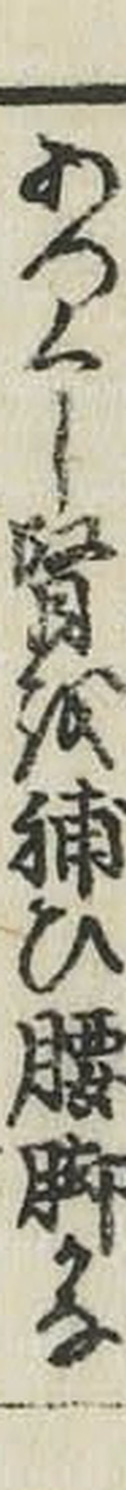あつくし腎を補ひ腰脚かな
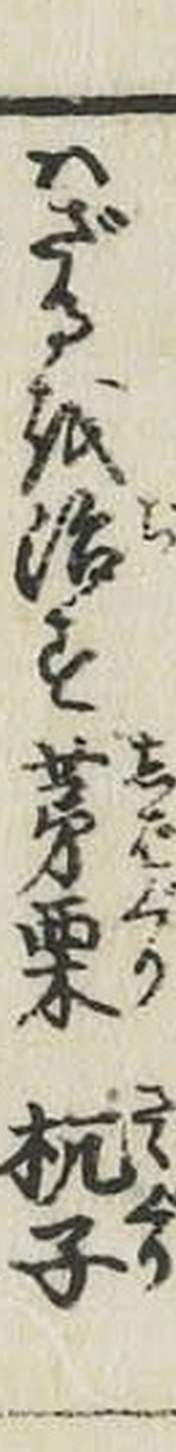はざるを治す茅栗杭子
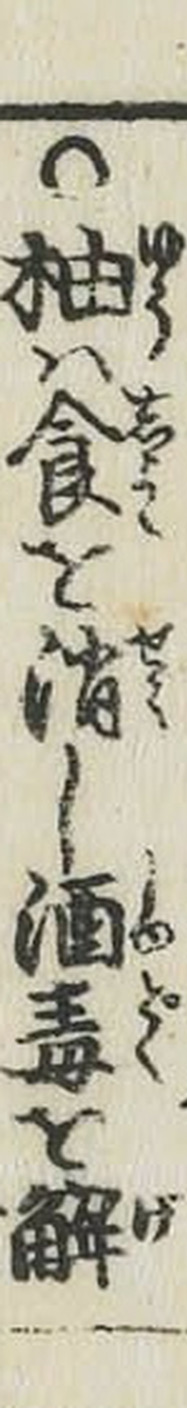○柚は食を消し酒毒を解
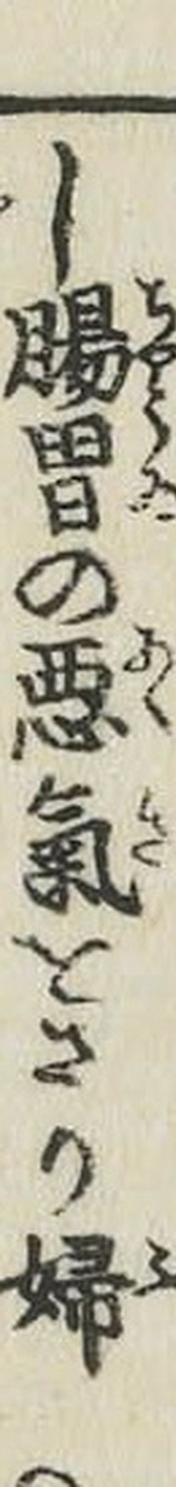し腸胃の悪気をさり婦
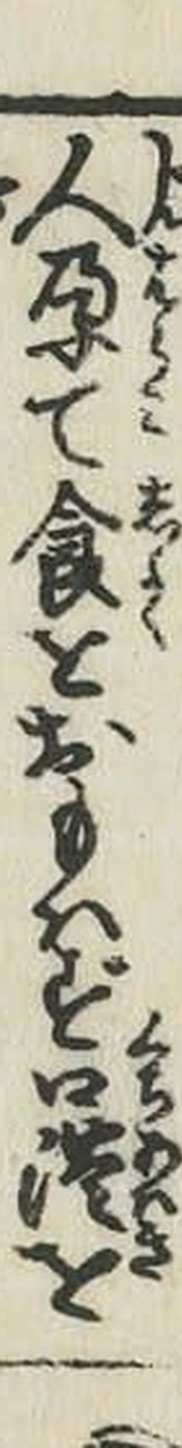人孕て食をおもはず口淡を
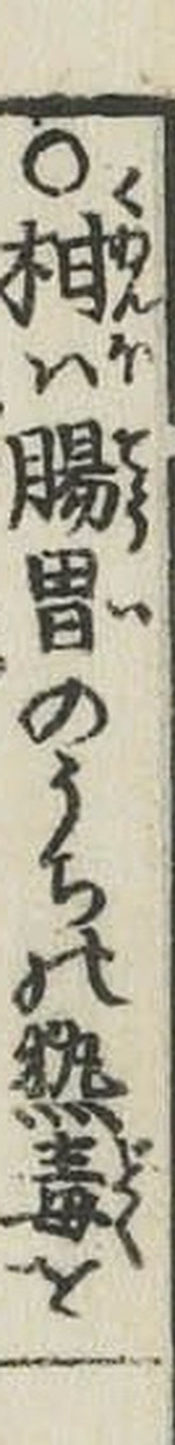○柑は腸胃のうちの熱毒を
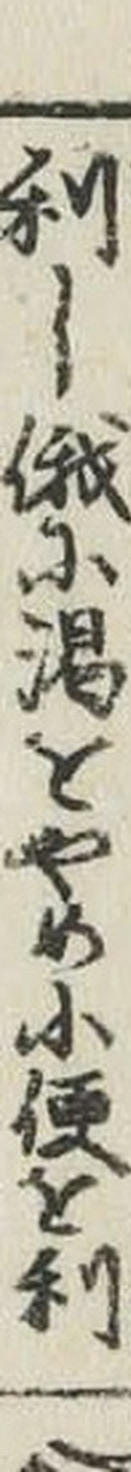利し俄に渇をやめ小便を利
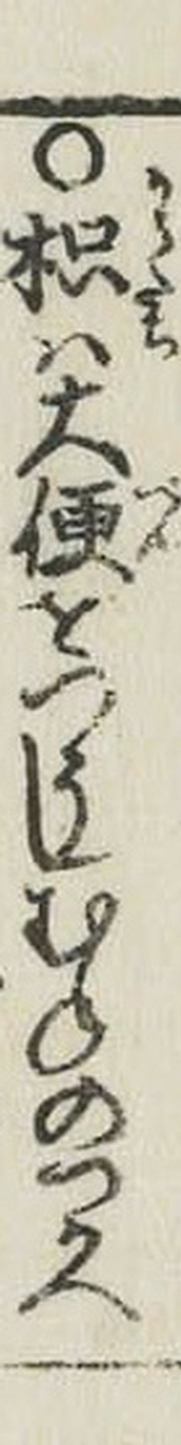○枳は大便をつうしむねのつかへ
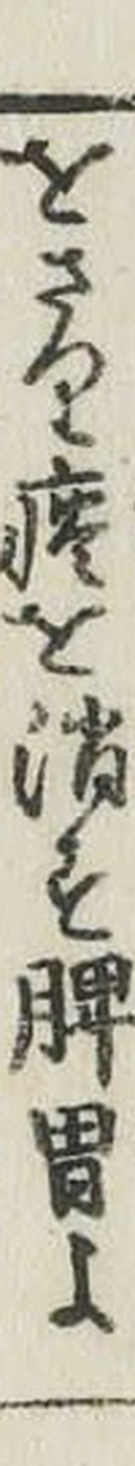をさり痰を消す脾胃よ
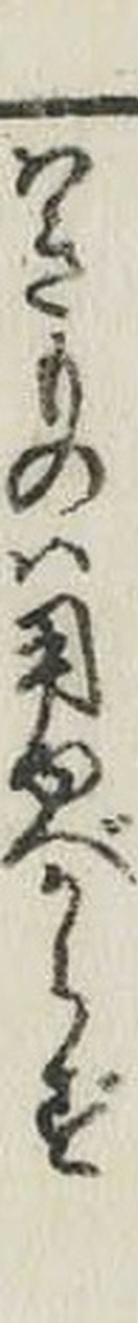はきものは用ゆべからず
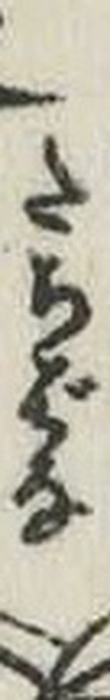たちばな
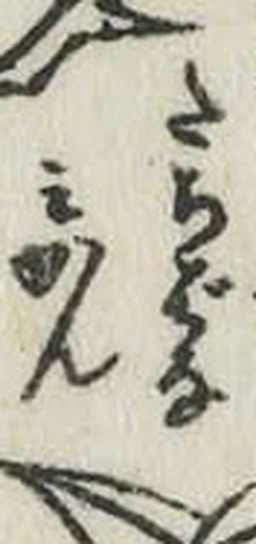みかん
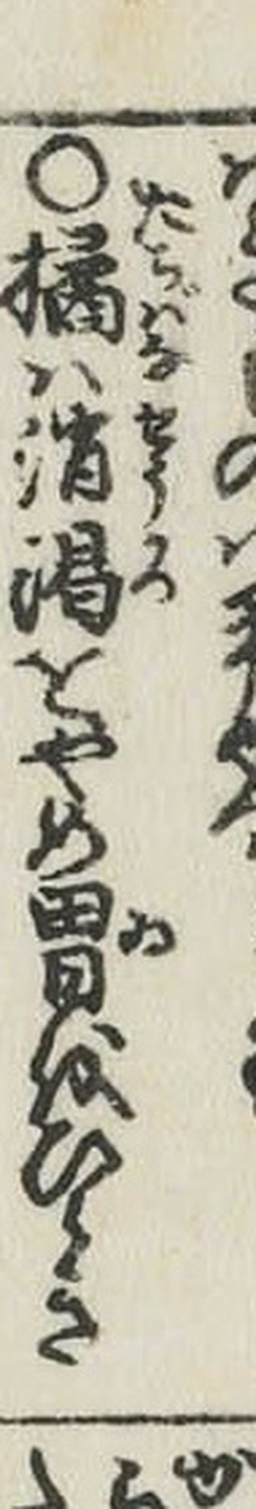○橘は消渇をやめ胃をひらき
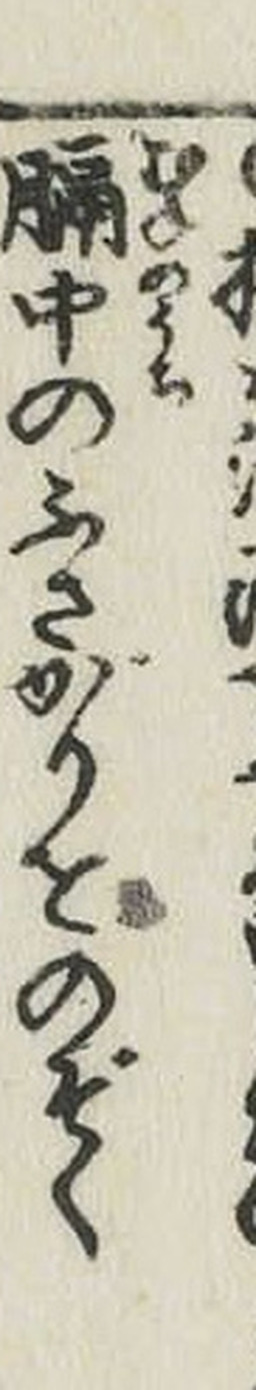膈中のふさがりをのぞく
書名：増補頭書訓蒙図彙大成 10巻 8:巻之17-19
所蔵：東京学芸大学教育コンテンツアーカイブ
